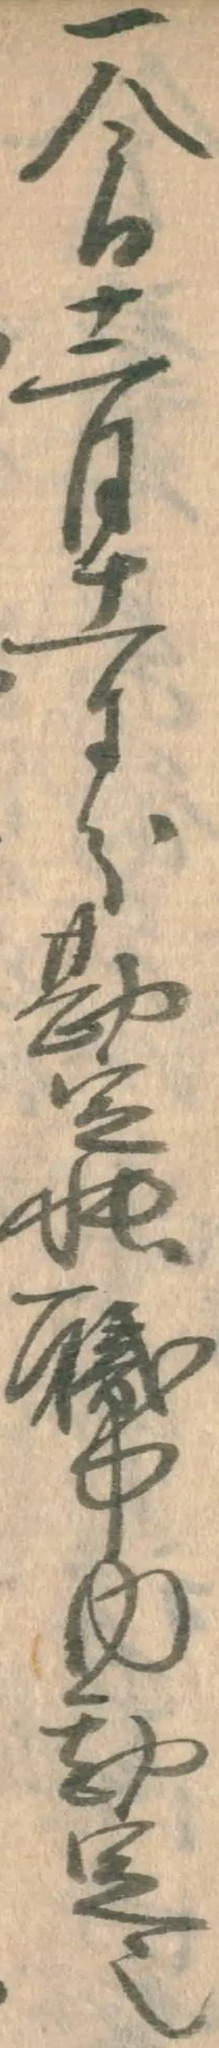一今日十二月十一月分勘定帳職中内勘定也
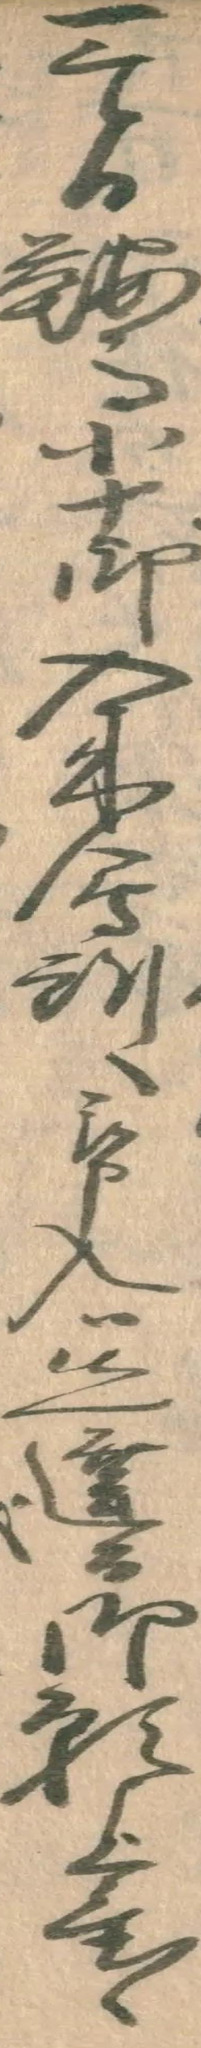一今日鞍馬小十郎入来会所へ被申入ハ先達而御願申上置候
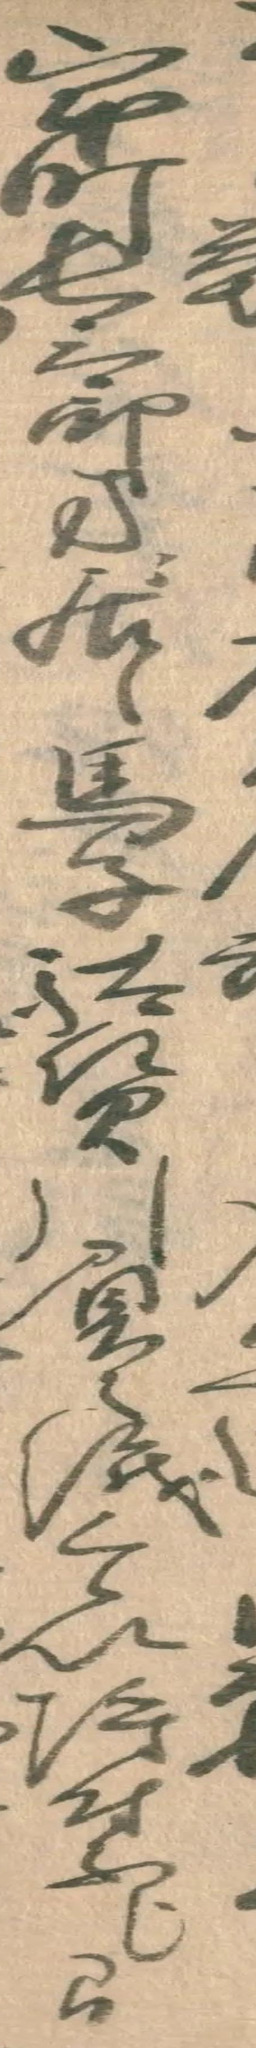山本町長三郎方ニ居候馬子駄賃引負之儀今以埒付不申候間
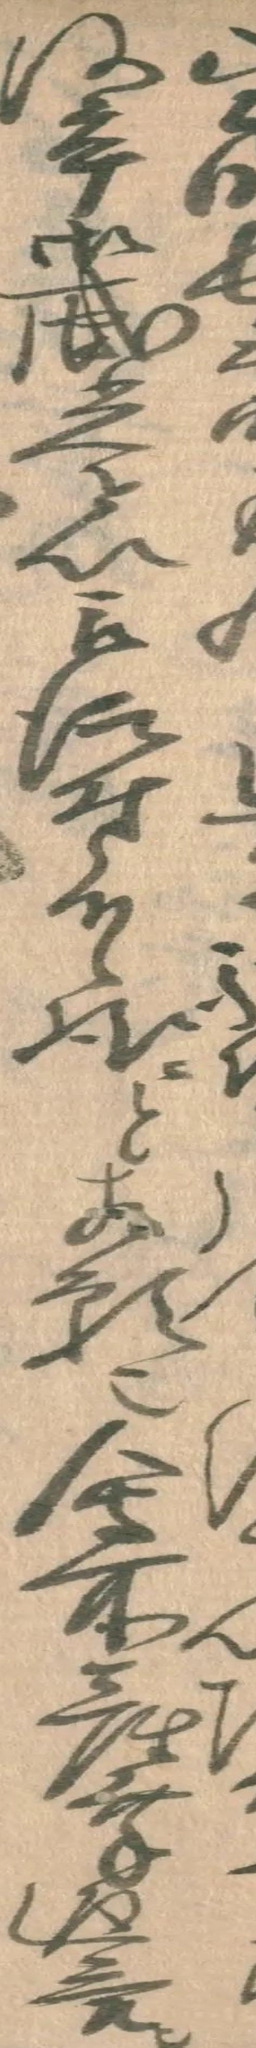何卒御威光を以被仰付下候様ニと相願也会所産幸返答被
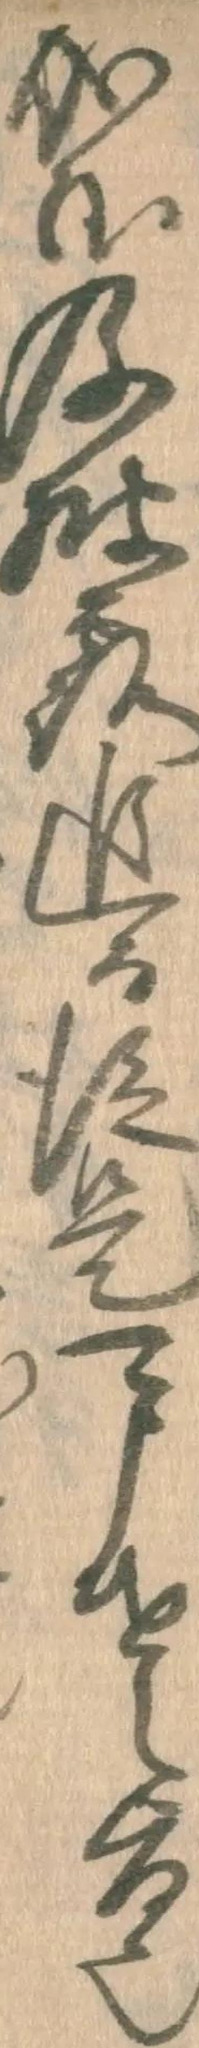成儀及披露追而従是可申遣之旨也
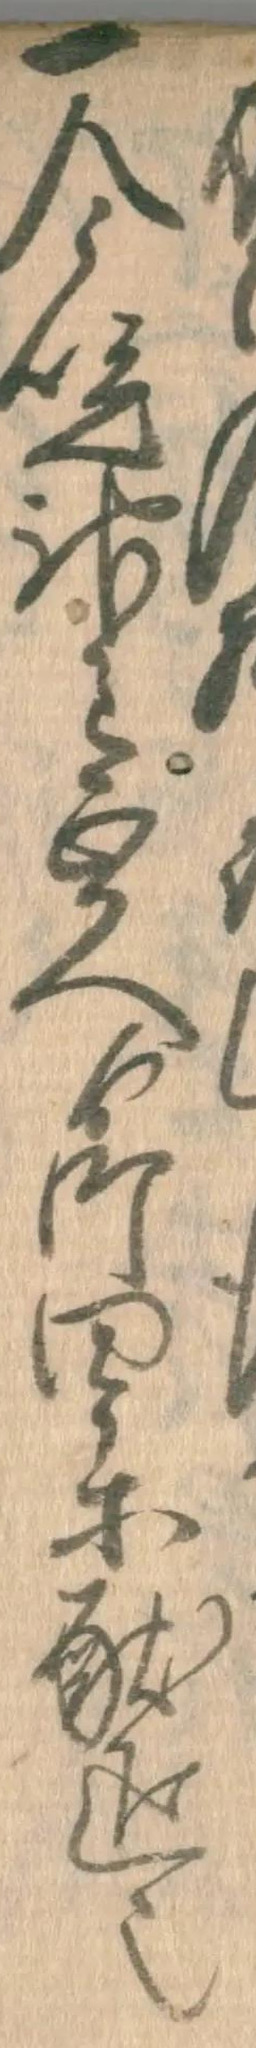一今晩神主正久ゟ御田楽献進也
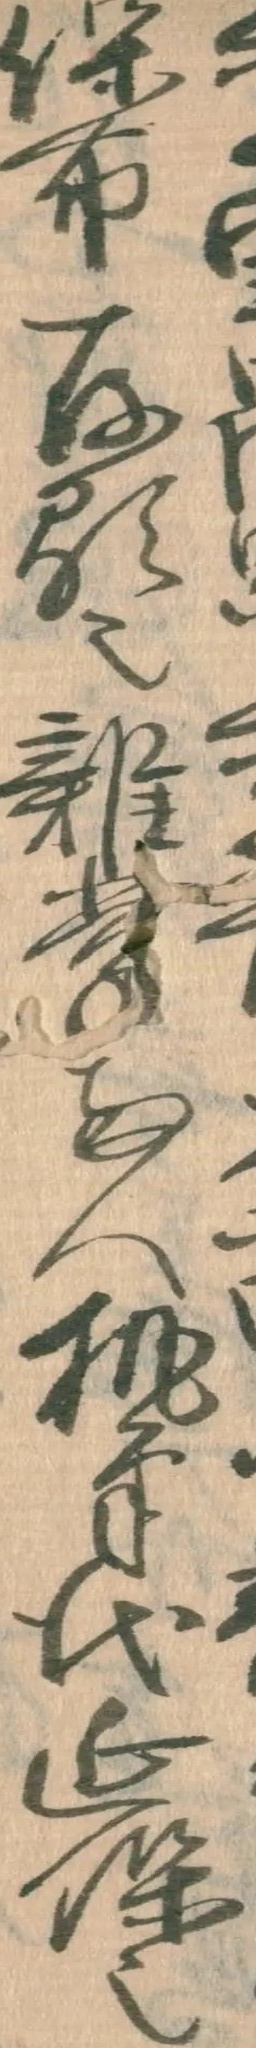保布存顕也雑掌両人執筆代延保也
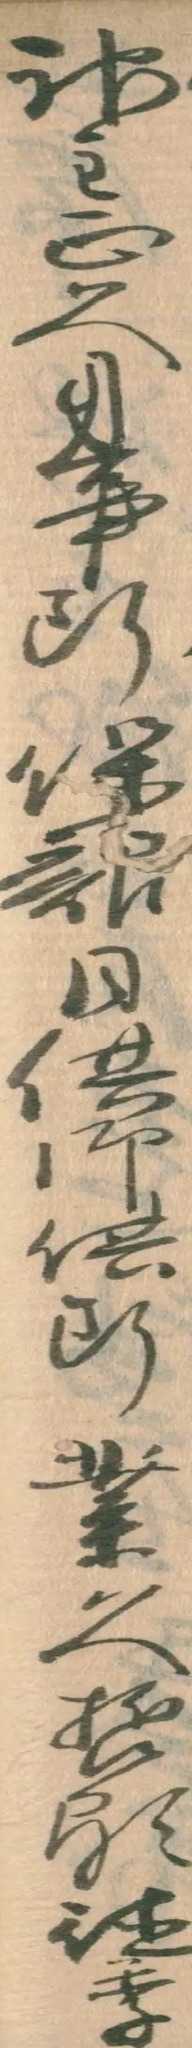神主正久用事断保韶日供御供断業久哲顕徳季
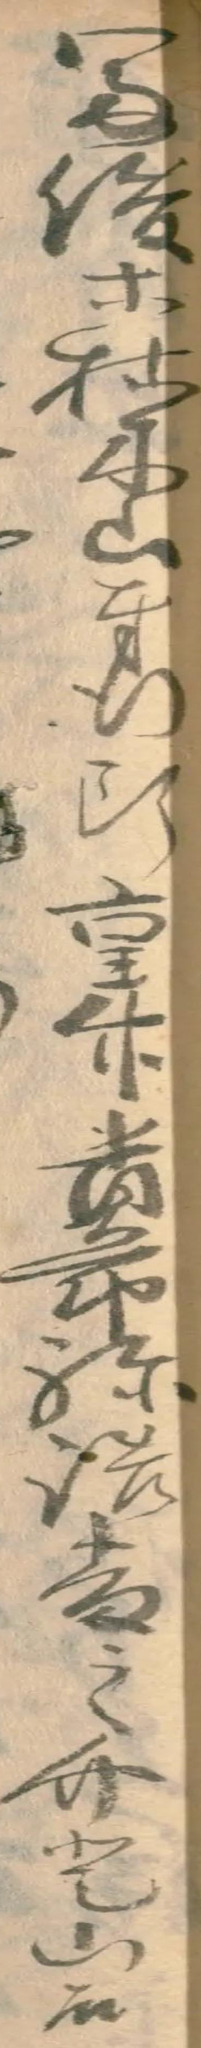冨俊等枯木山奉行断重竹貴布祢詰番之介登山故
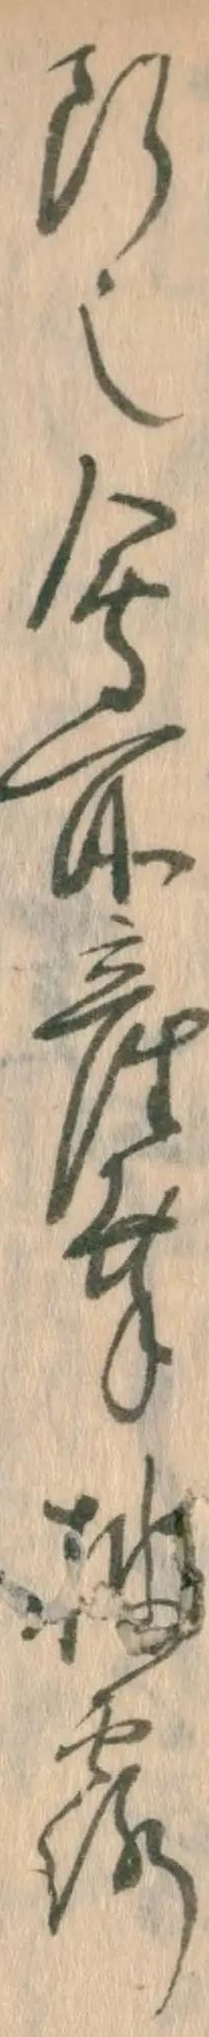断也会所産幸披露
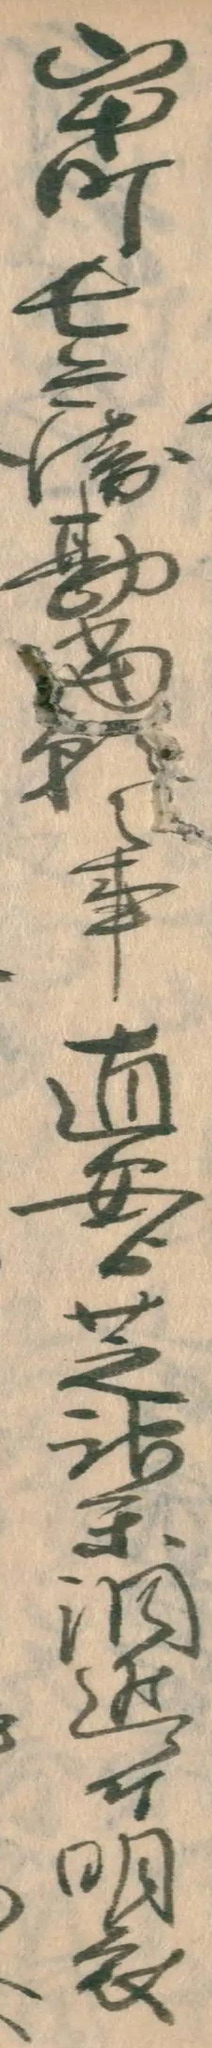山本町長兵衛勘当願之事直安ゟ芝神楽調進ニ付明衣
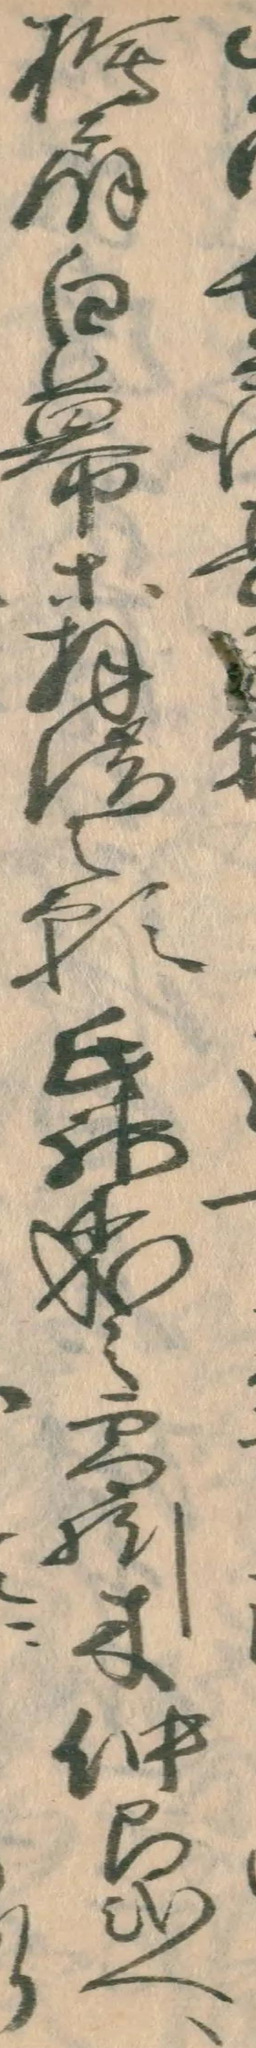檜扇白幕等拝借之願氏神森之雪倒木仲間弐人へ
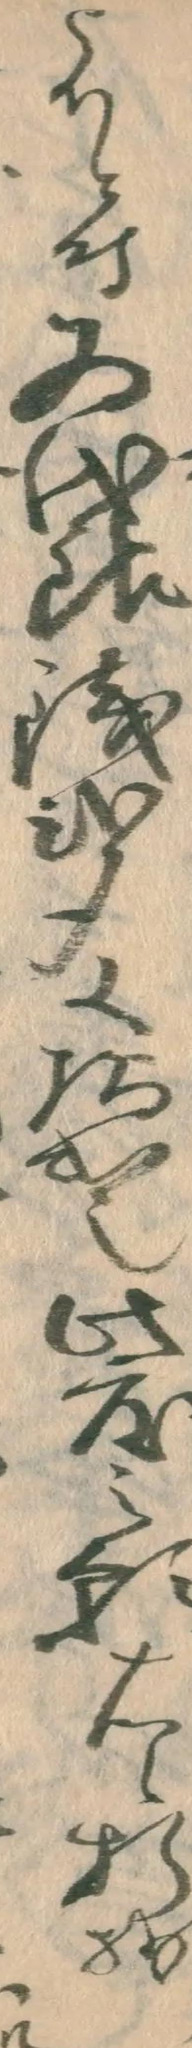被下ニ付為代銀銭弐貫文指出也此度之願右へ打掛り
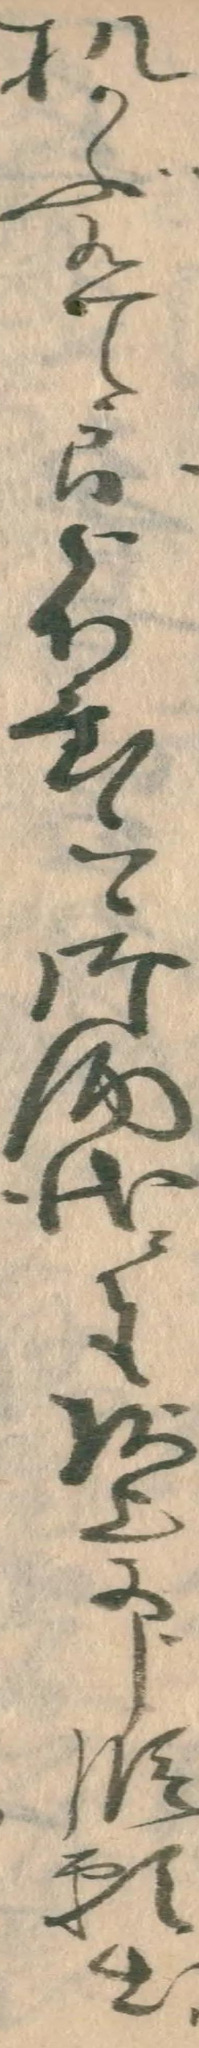机？かぶ有之候間被下置候ハヽ御酒代ニても指上可申段願出ル
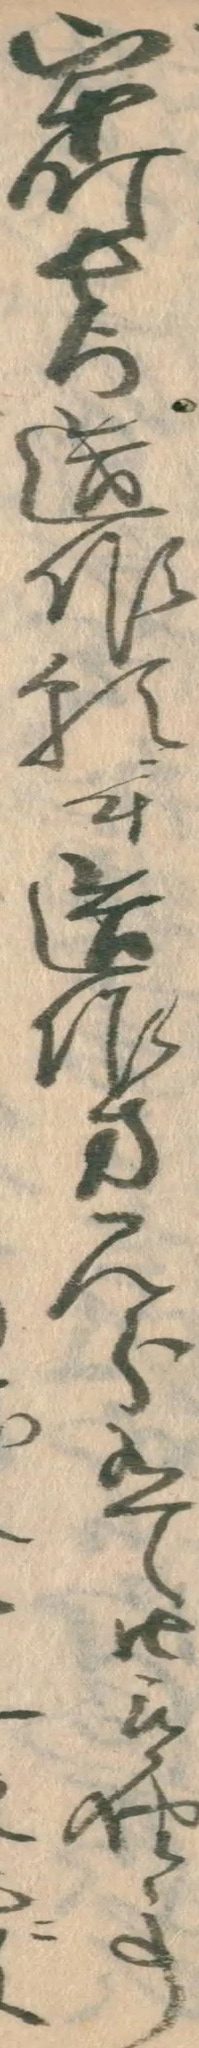山本町長右衛門造作願ニ付造作方見分有之由被届事
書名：賀茂社記録. 第60冊
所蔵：国立国会図書館 National Diet Library, JAPAN
